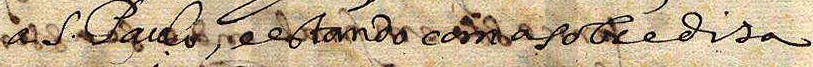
a S. Paulo, e estando com a sobredita
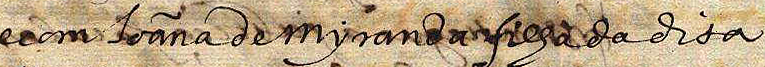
e com Joāna de myranda filha da dita
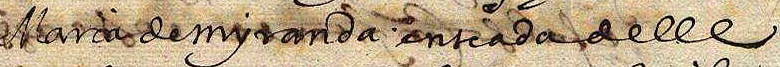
Maria de myranda enteada delle
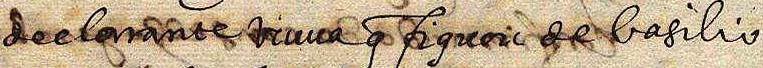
declarante viuua q̄ fiquou de basilio
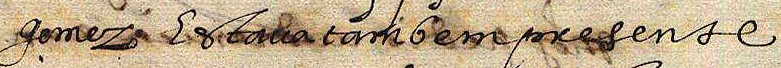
gomez E estava tambem presente
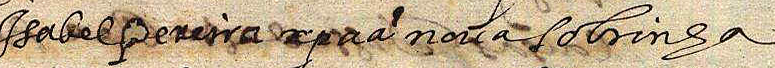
Jsabel pereira xpaã noua sobrinha
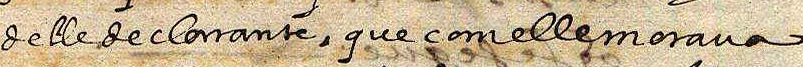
delle declarante, que com elle moraua
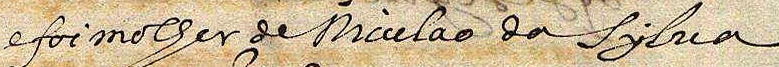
e foi molher de Niculao da Sylua
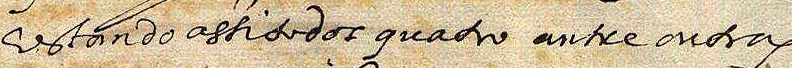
E estando ass̄i todos quatro antre outras
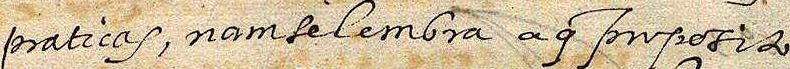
praticas, nam se lembra a q̄ proposito
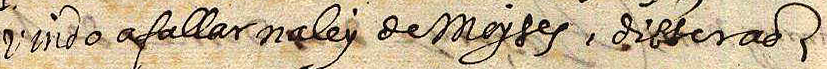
vindo a fallar na ley de Moyses, diss̄eraõ
